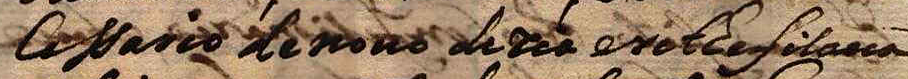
Cessario de nouo dezia e ratheficaua
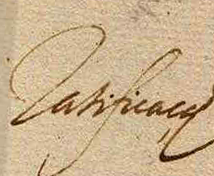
Ratificaçā
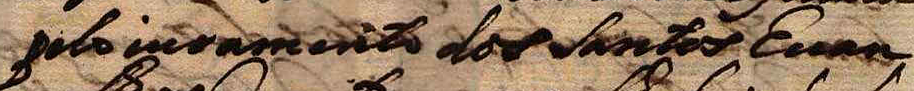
pelo iuramento dos Santos Euan
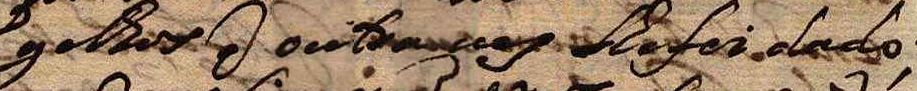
gelhos q̄ outra uez lhe foi dado;
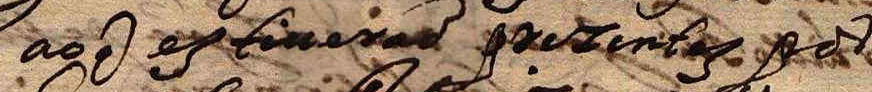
ao q̄ estiueraõ prezentez por
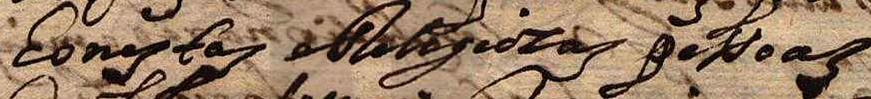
honeztaz e Relegiozaz pessoaz
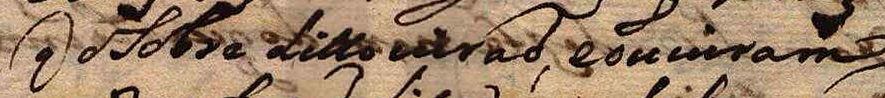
q̄ o sobreditto uiraõ, e ouuiram
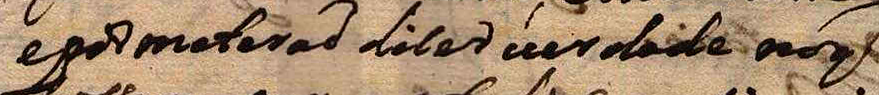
e pormeteraõ dicer uerdade no q̄
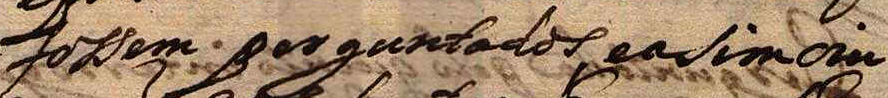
fossem perguntados, e asim o iu
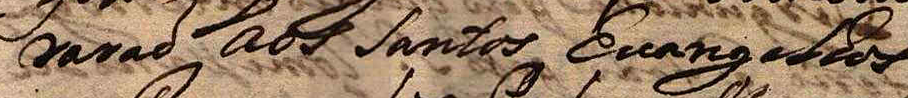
raraõ aos Santos Euangelhos
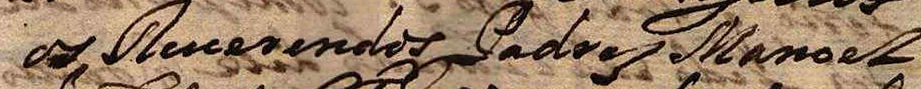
os Reuerendos Padrez ManoeL
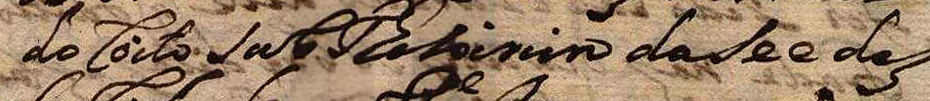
do Coito sub Thesoireiro da See dez
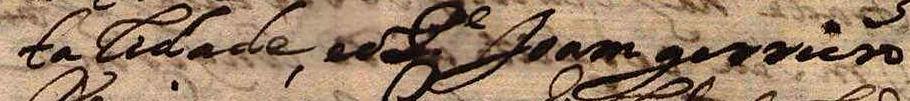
ta Cidade, e o Pe Joam gerreiro
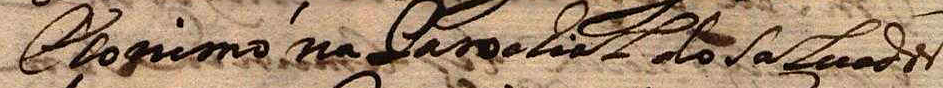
Econimo na Parochial do Saluador
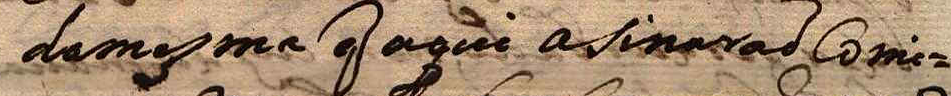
da mezma q̄ aqui asinaraõ Comi
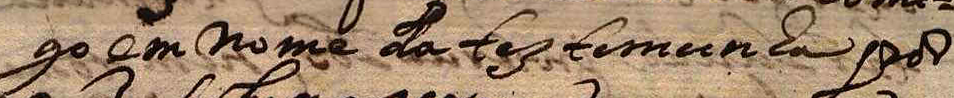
go em nome da teztemunha por
